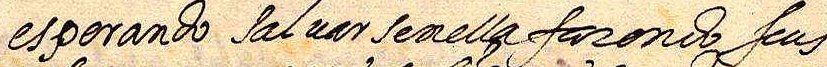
esperando saluar se nella fazendo seus
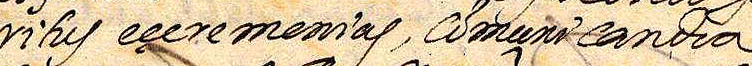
ritus e çeremonias, cōmunicandoa
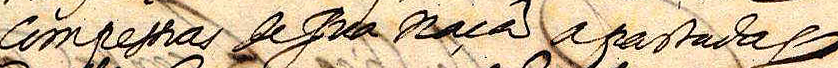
com pessoas de sua naçaõ apartadas
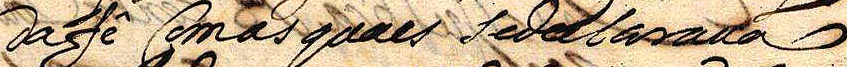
da fê Com as quaes se declaraua
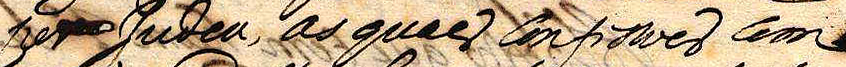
per Judeu, as quaes confissoẽs com
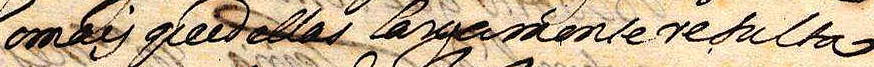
o mais que dellas largamente resulta
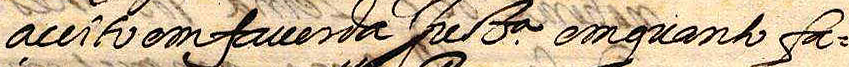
açeito em fauor da Just.a em quanto fa
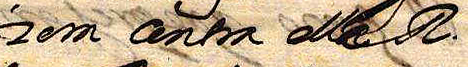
zem contra elle R.
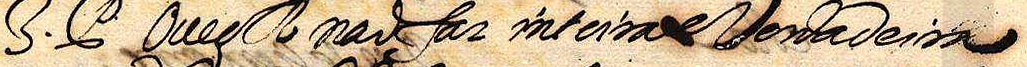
3. P Que o R naõ faz inteira e Verdadeira
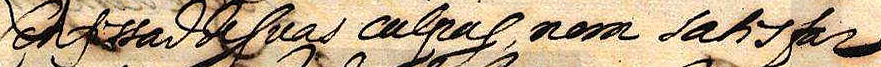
Confissaõ de suas culpas, nem satisfaz
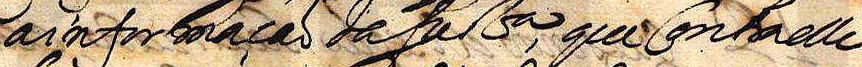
a informaçaõ da Justa, que Contra elle
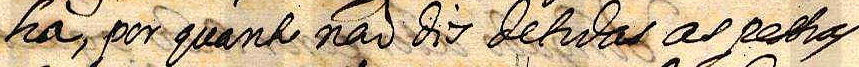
ha, por quanto naõ dis de todas as pessoas
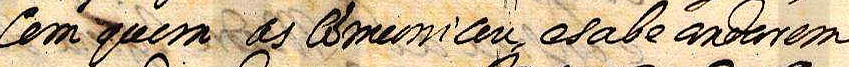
com quem as cōmunicou, e sabe andarem
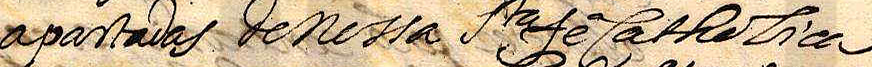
apartadas de nossa sta fê Catholica
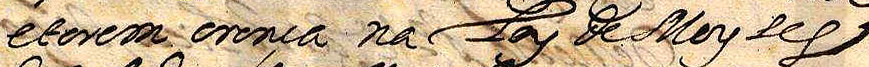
e terem crença na Ley de Moyses
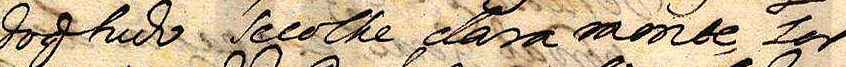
do q̄ tudo se colhe claramente, ser
